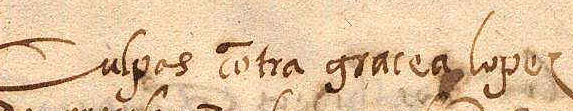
Culpas cōtra gracea lopez
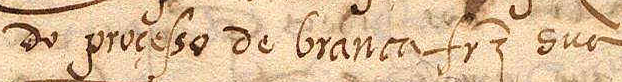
do processo de branca frz̄ sua
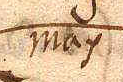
mãy
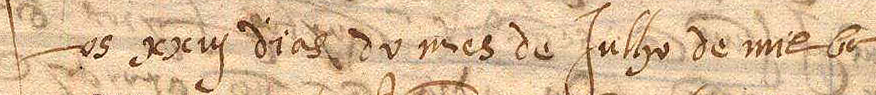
Aos xxiij dias do mes de Julho de mil bc
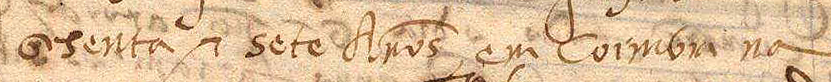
sesenta e sete An̄os em Coimbra na
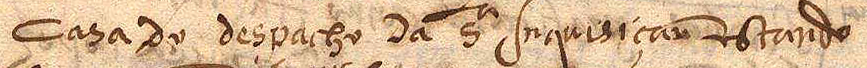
Casa do despacho da Sta Jnquisição estando
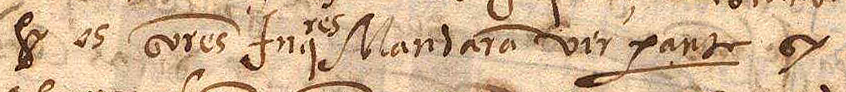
hy os s̄ores Jnqres Mandarā vir ꝑante sy
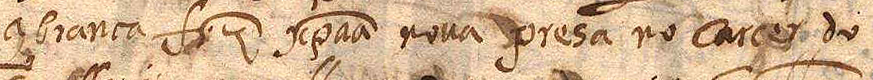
a branca fr̄z xpāa noua presa no carer do
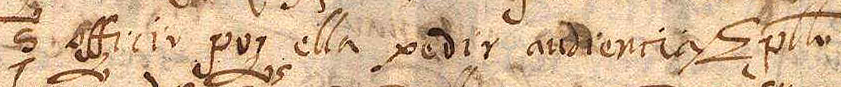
sto officio por ella pedir audiencia E p̄llo
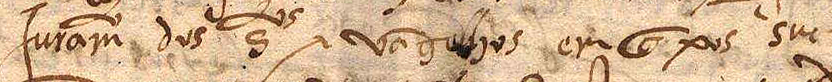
Juramto dos Stos evāgelhos em q̄ pos sua
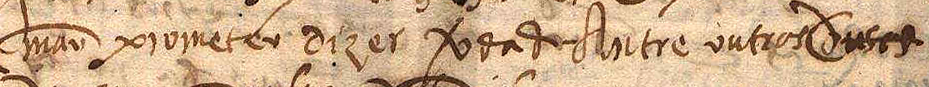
mão prometeo dizer ꝟdade Antre outras cousas
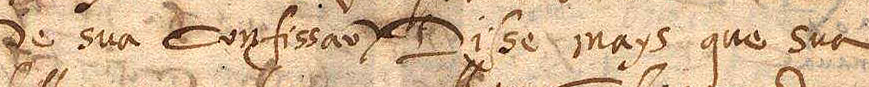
de sua Confissaõ Disse mays que sua
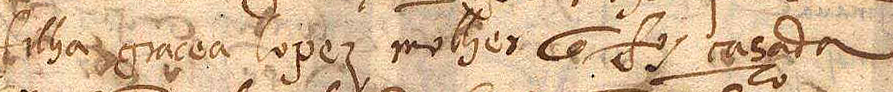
filha gracea lopez molher q̄ foj casada
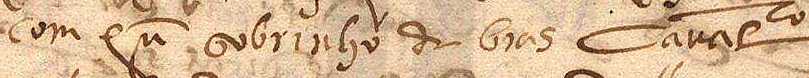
com hū sobrinho de bras Caualro
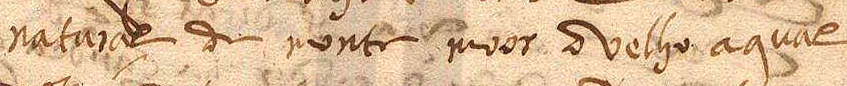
natural de monte moor o velho a qual
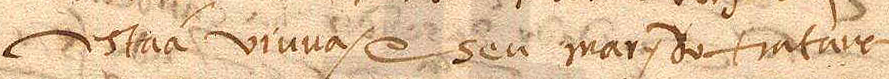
estaa viuua / e seu marydo trataua
